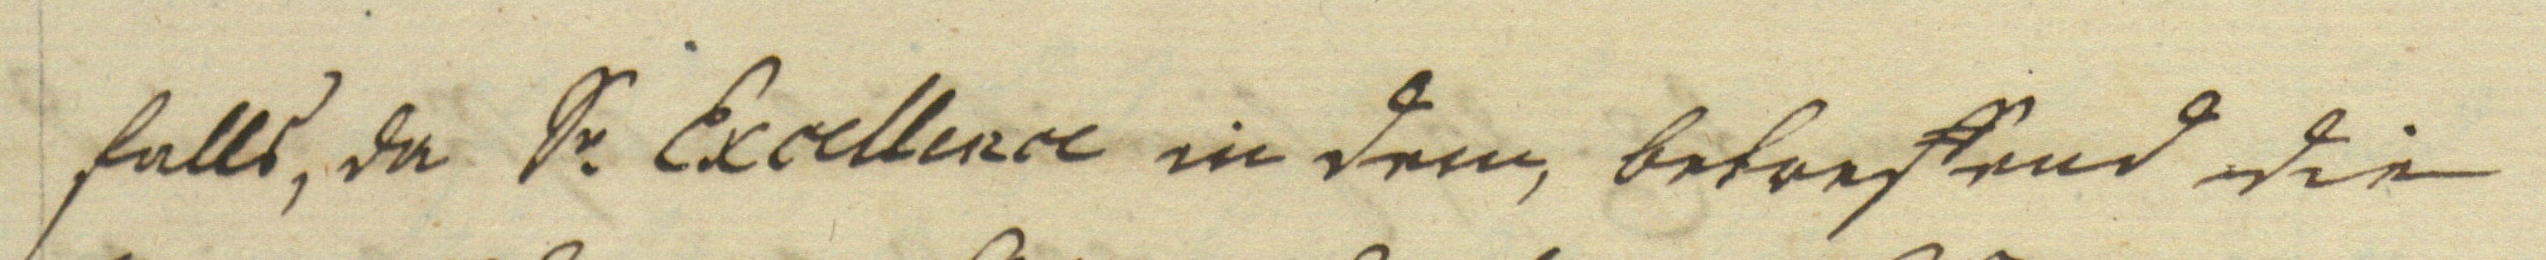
falls, da Sr. Excellence in dem, betreffend die
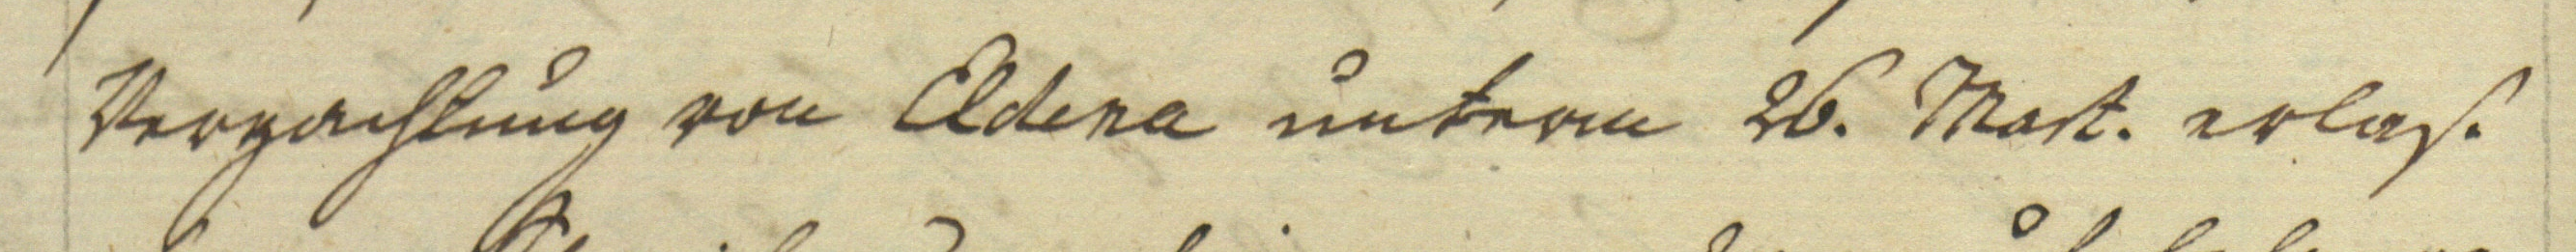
Verpachtung von Eldena unterm 26. Mart. erlas¬
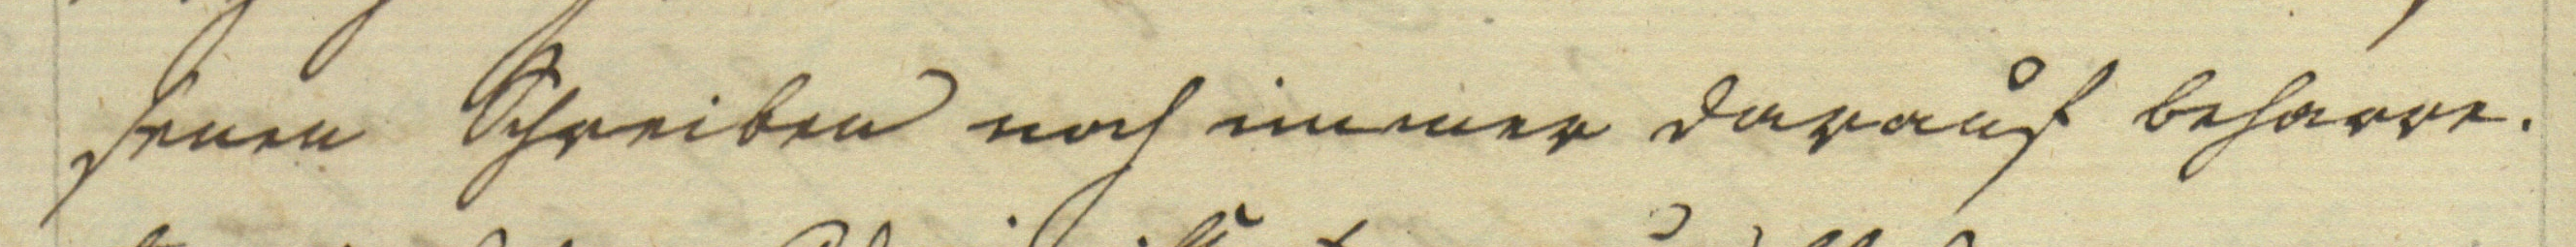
senen Schreiben noch immer darauf beharre¬
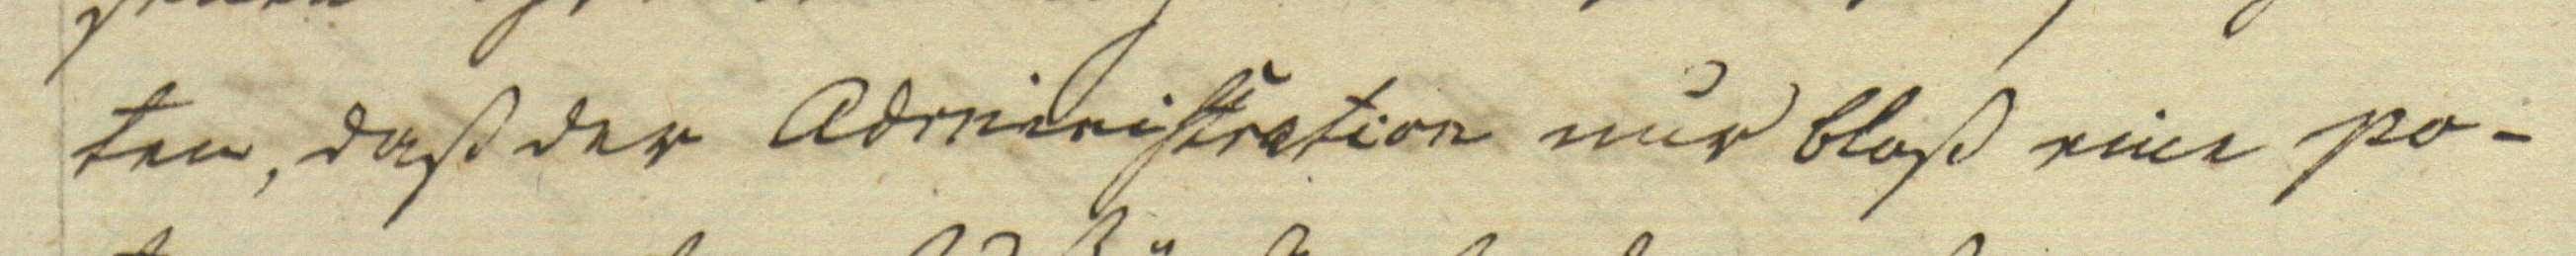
ten, daß der Administration nur bloß eine po¬
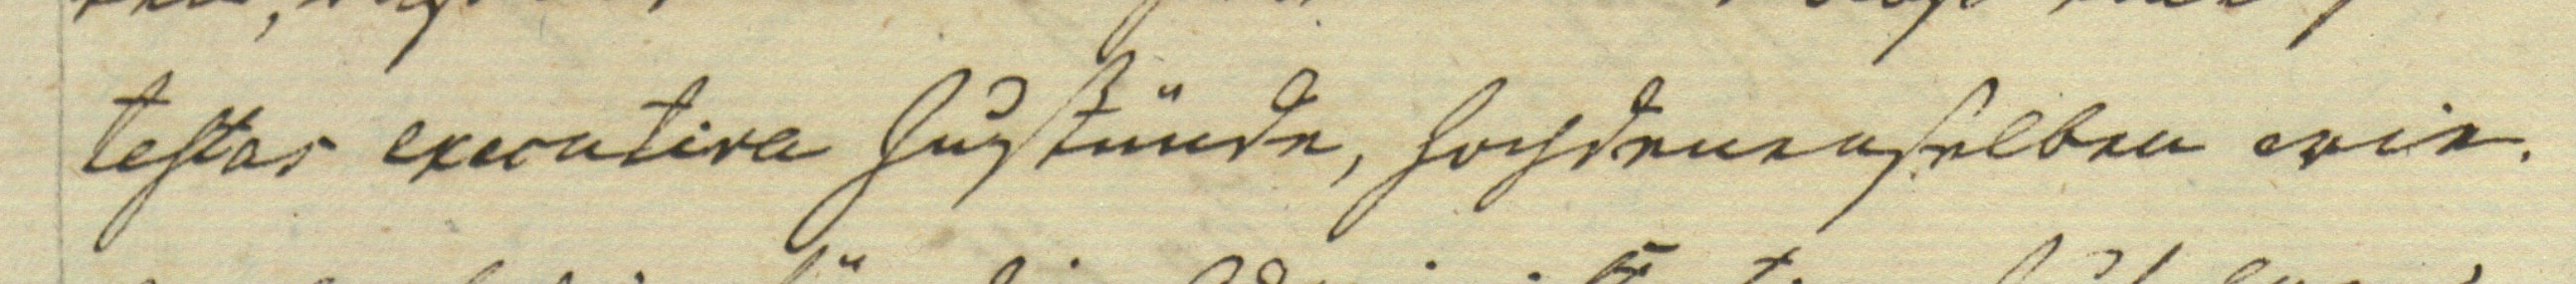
testas executiva zustünde, hochdenenselben wie¬
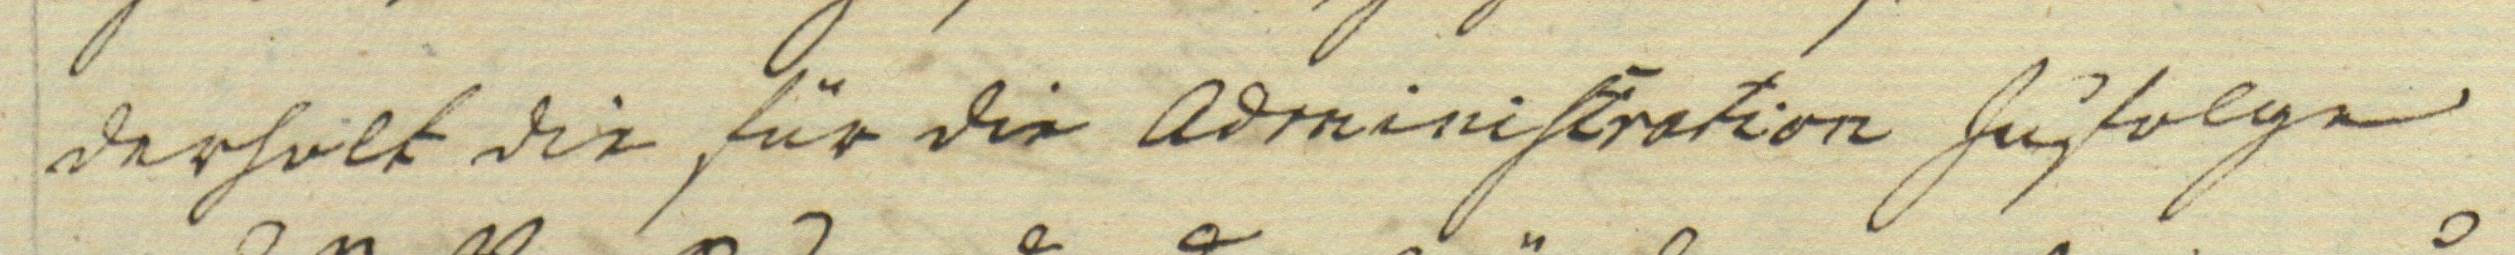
derholt die für die Administration zufolge
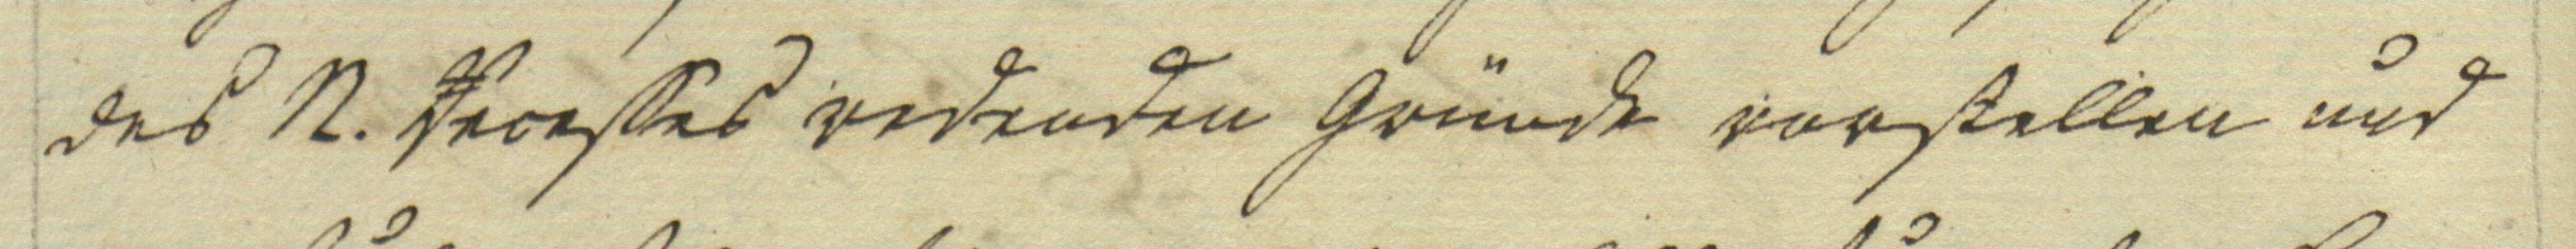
des N. Recesses redenden Gründe vorstellen und
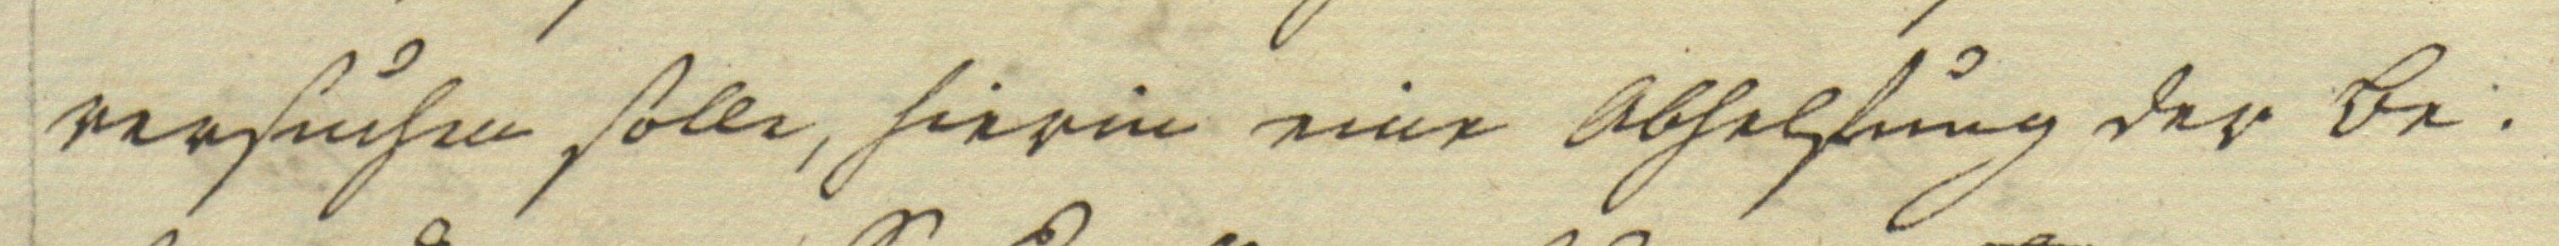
versuchen solle, hierin eine Abhelfung der Be¬
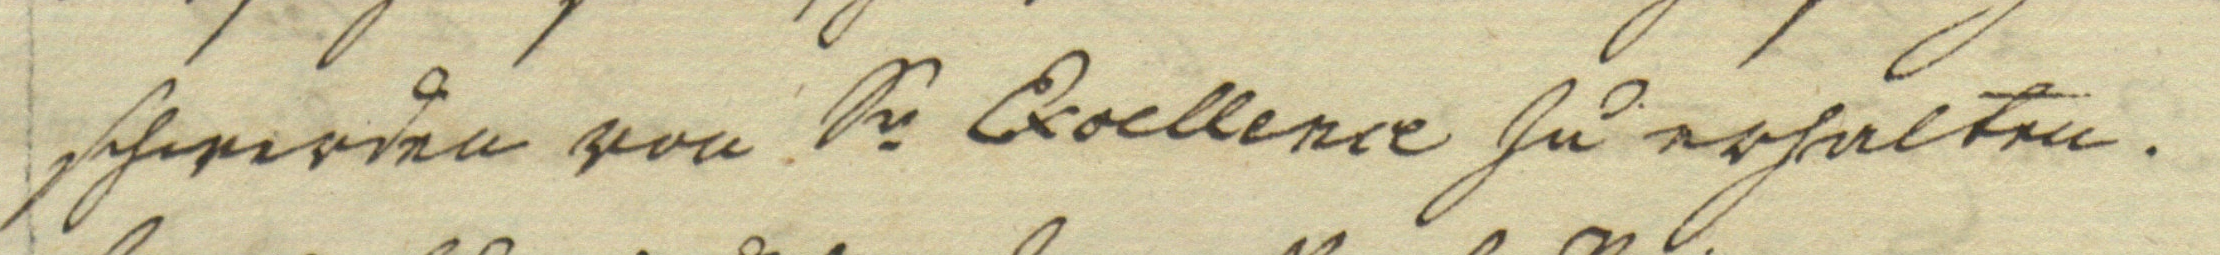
schwerden von Sr Excellence zu erhalten.
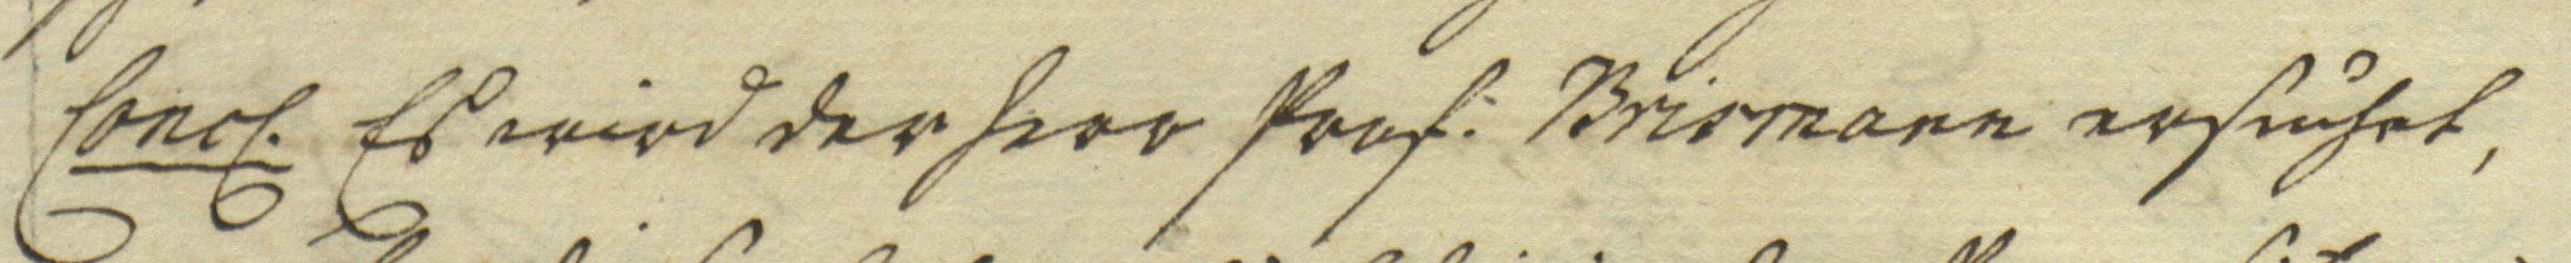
Concl. Es wird der Herr Prof. Brismann ersuchet,
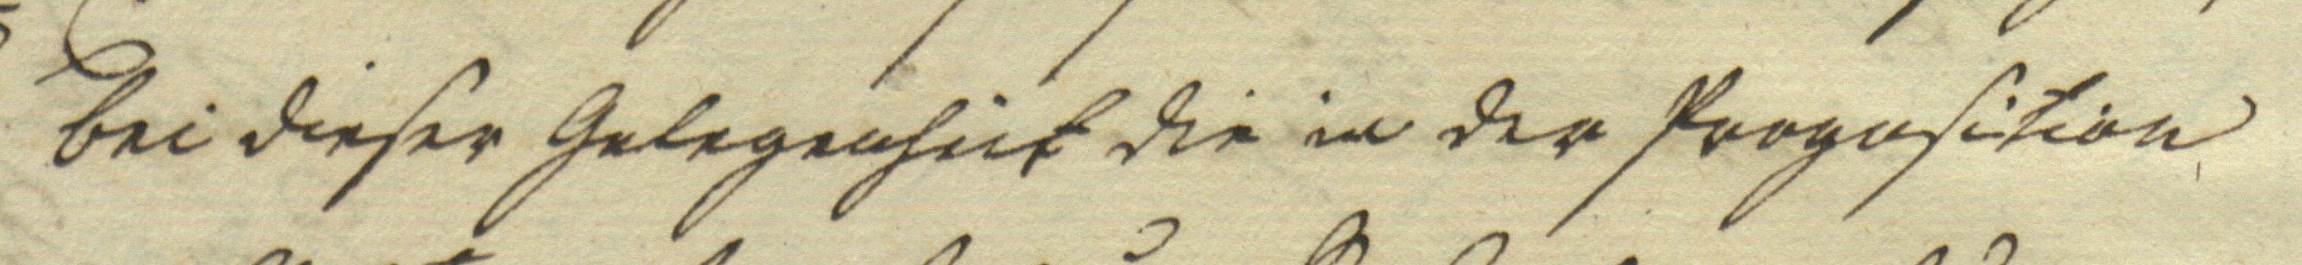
bei dieser Gelegenheit die in der Proposition
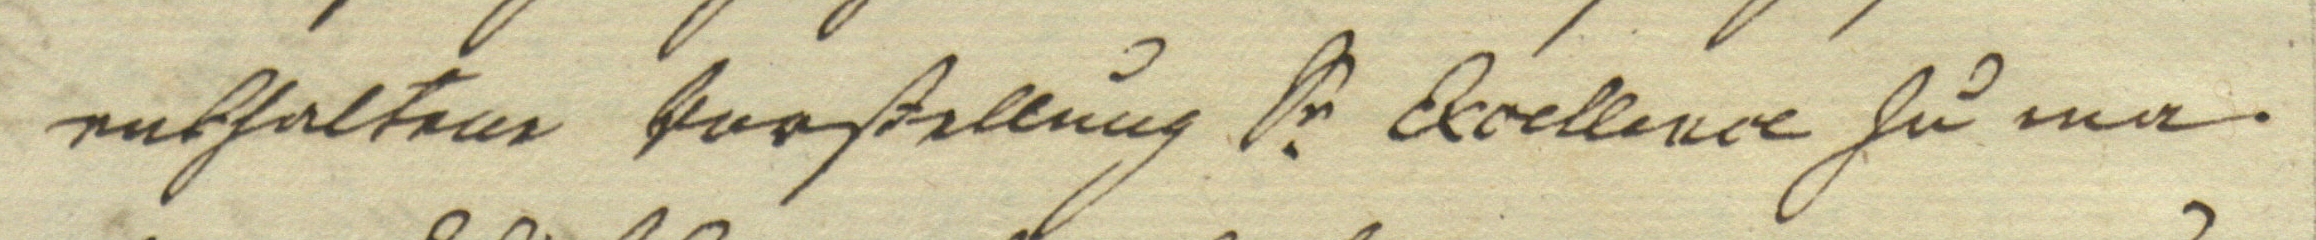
enthaltene Vorstellung Sr Excellence zu ma¬
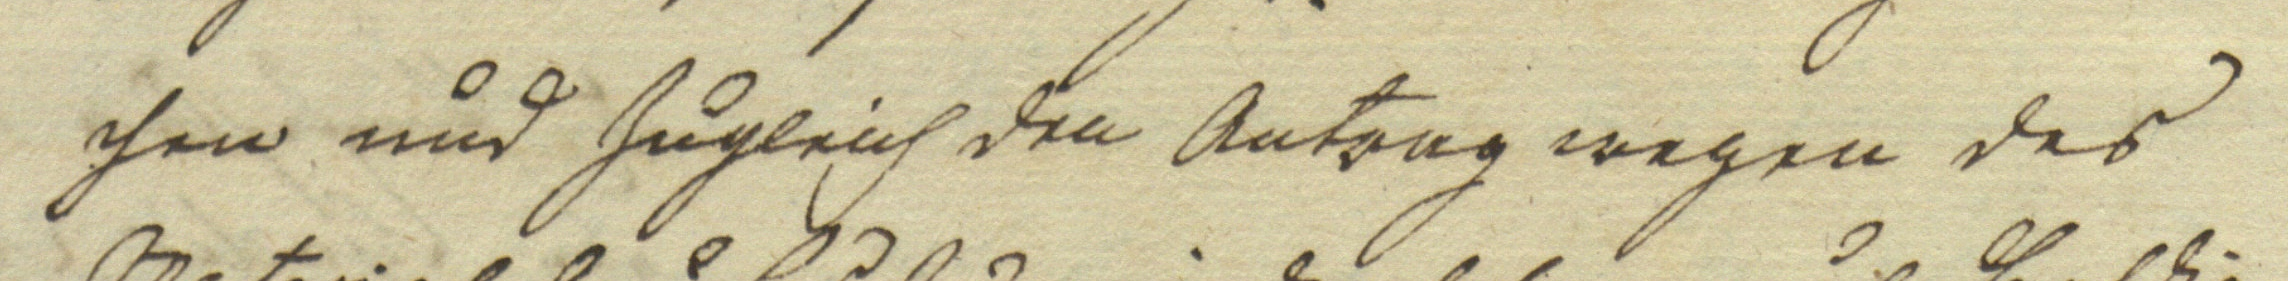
chen und zugleich den Antrag wegen des
